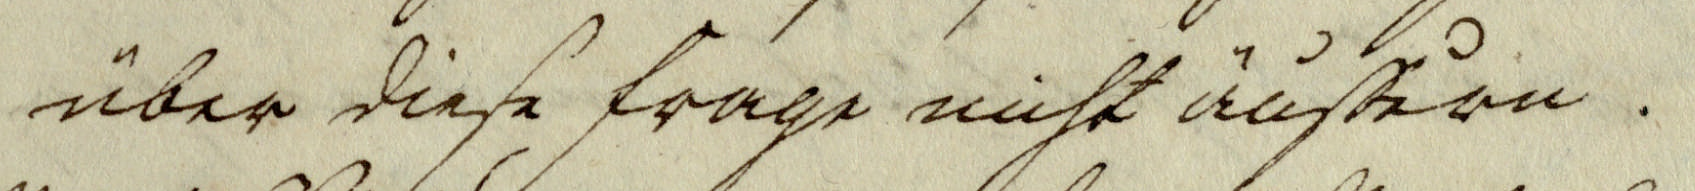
über diese Frage nicht äussern.
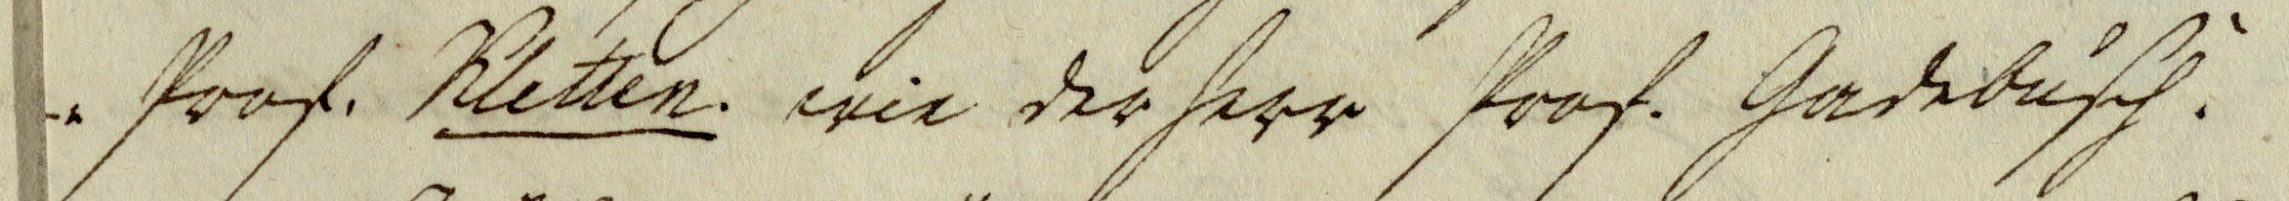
— . Prof. Kletten. wie der Herr Prof. Gadebusch.
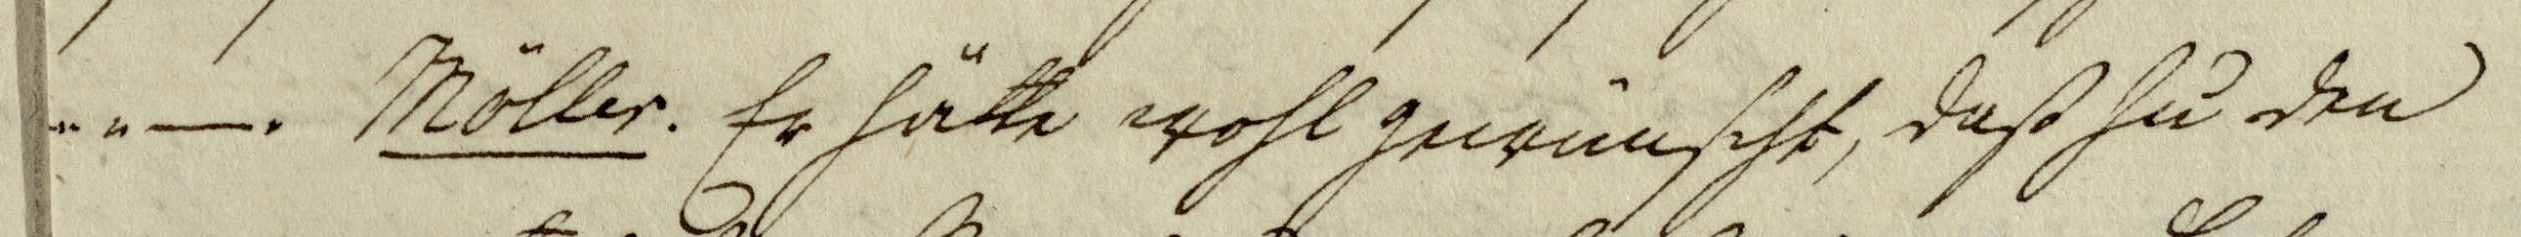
— " — . Möller. Er hätte wohl gewünscht, daß zu den
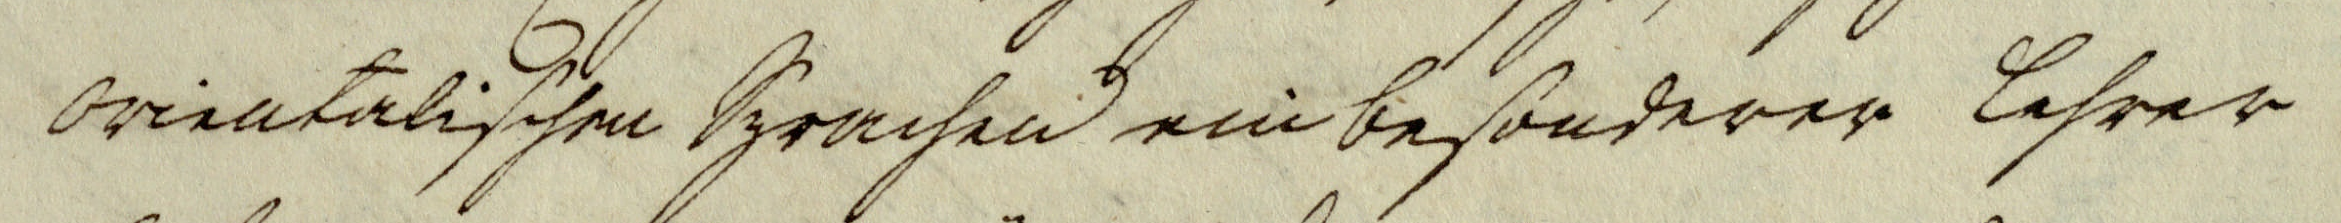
Orientalischen Sprachen ein besonderer Lehrer
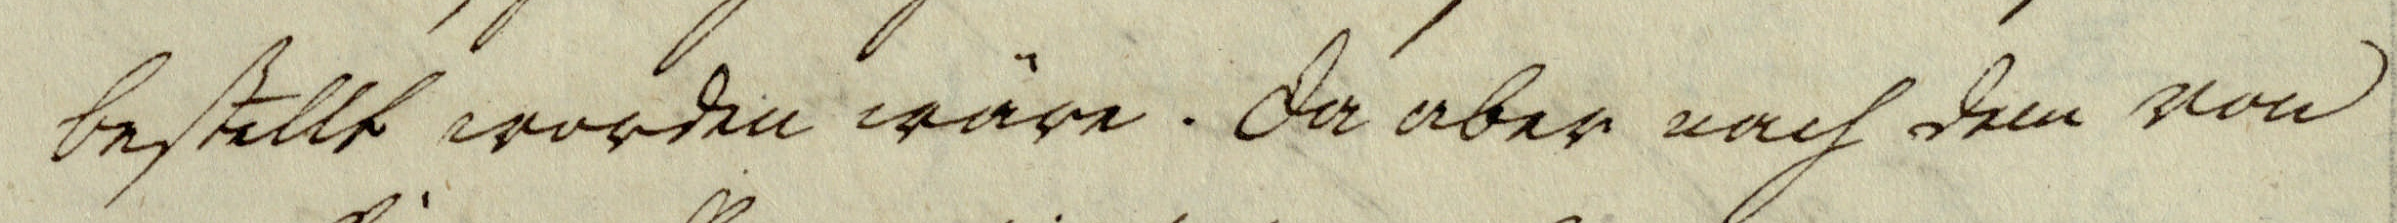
bestellt worden wäre. Da aber nach dem von
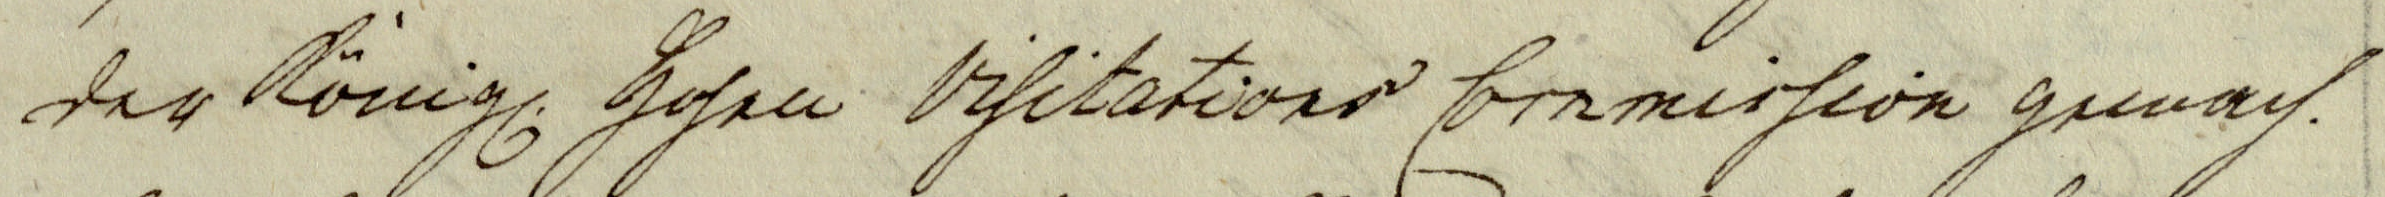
der Königl. Hohen Visitations Commission gemach¬
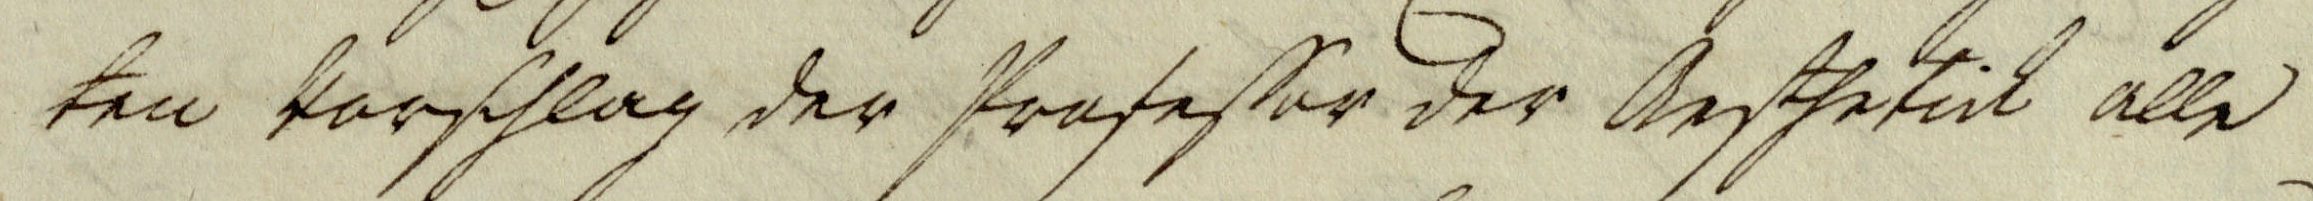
ten Vorschlag der Professor der Aesthetick alle
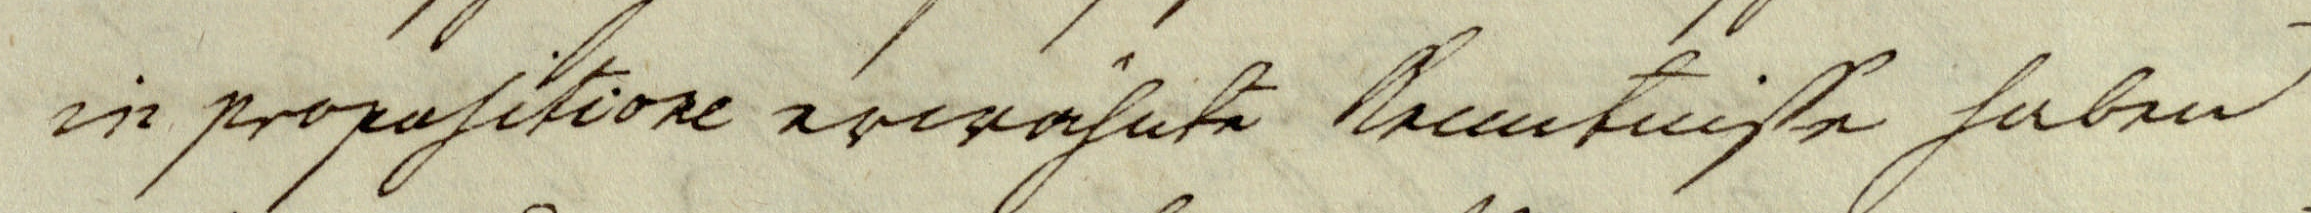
in propositione erwähnte Kenntnisse haben
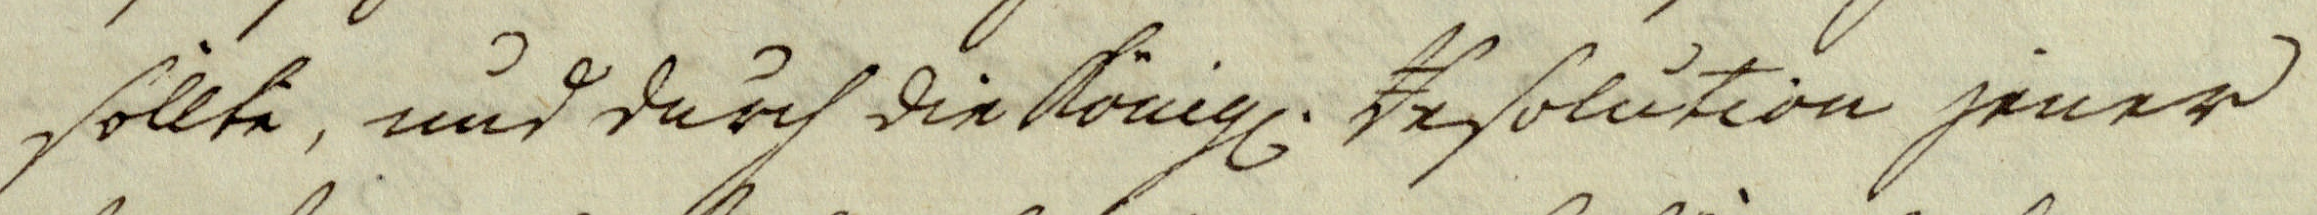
sollte, und durch die Königl. Resolution jener
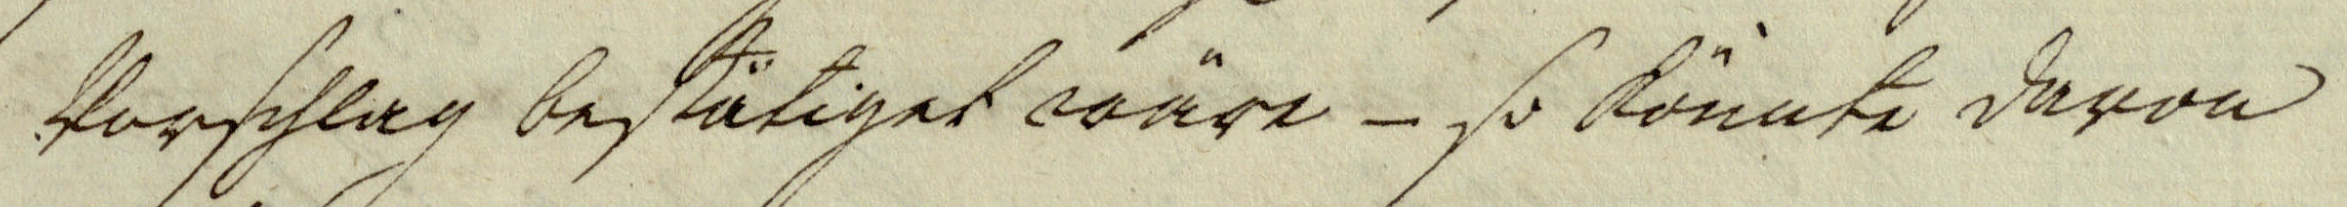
Vorschlag bestätiget wäre — so könnte davon
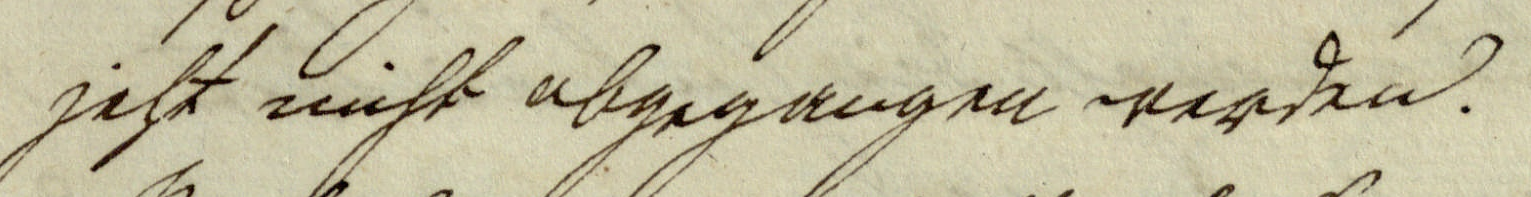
jetzt nicht abgegangen werden.
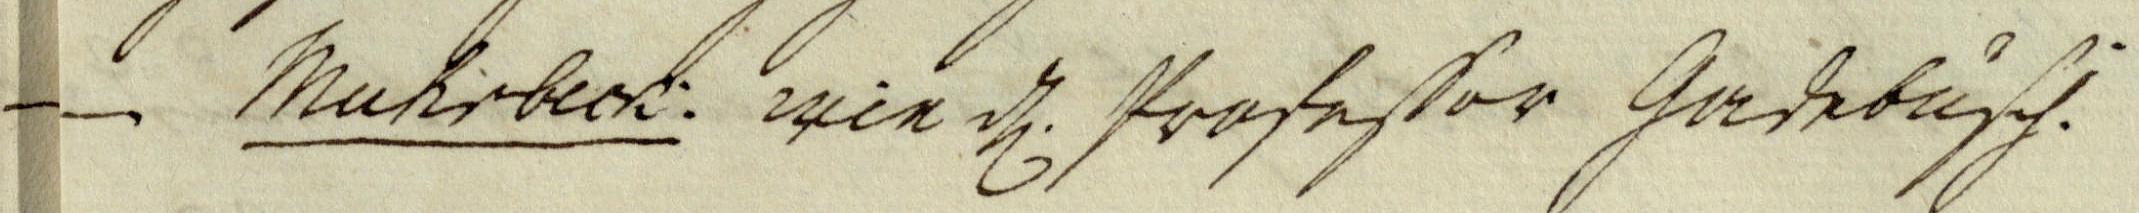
— " — . Muhrbeck. wie dh. Professor Gadebusch.
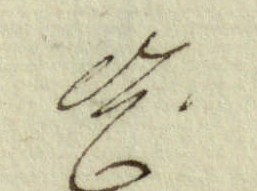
dh.
